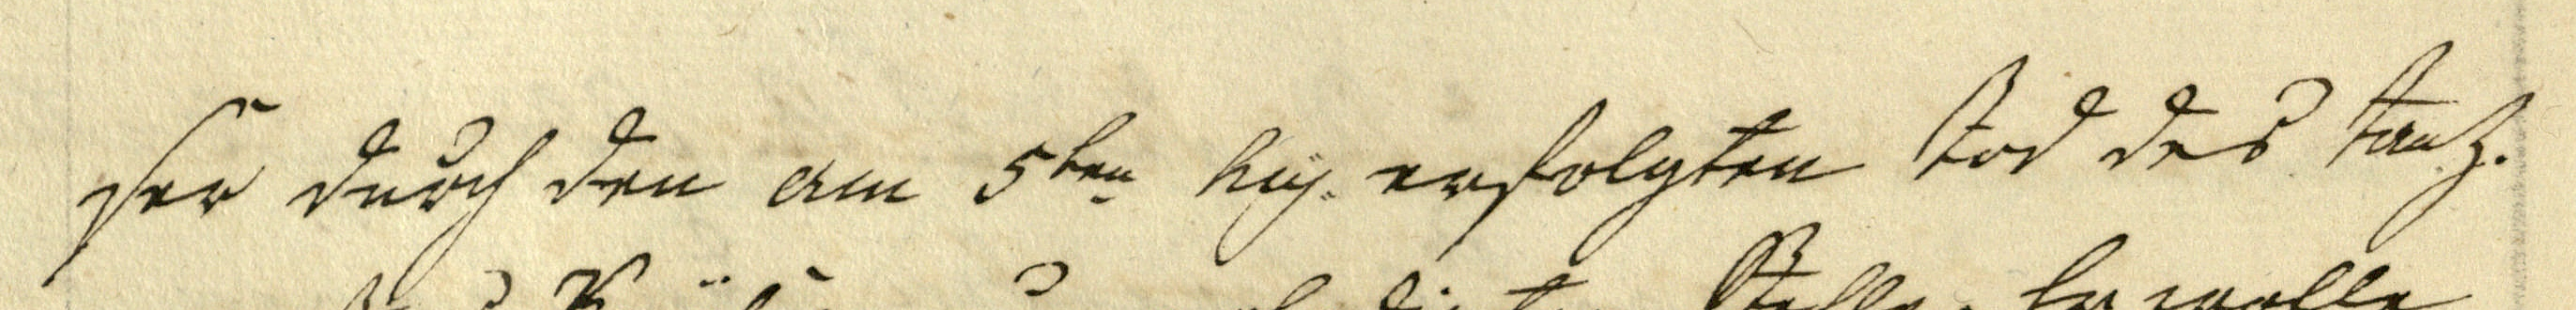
ser durch den am 5 ten huj. erfolgten Tod des Tanz¬
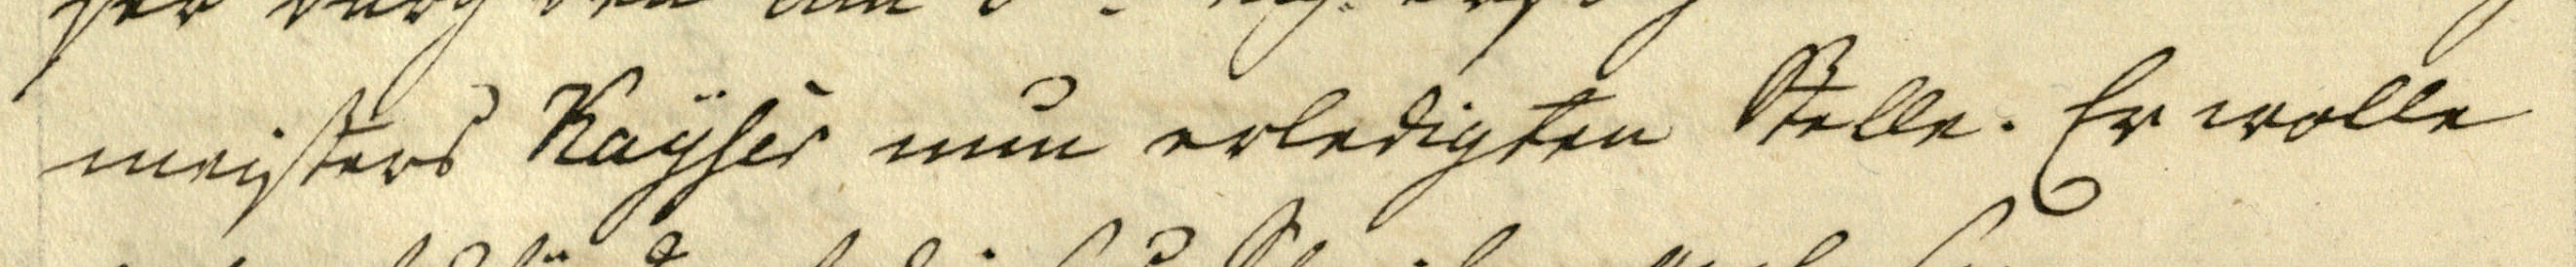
meisters Kaÿser nun erledigten Stelle. Er wolle
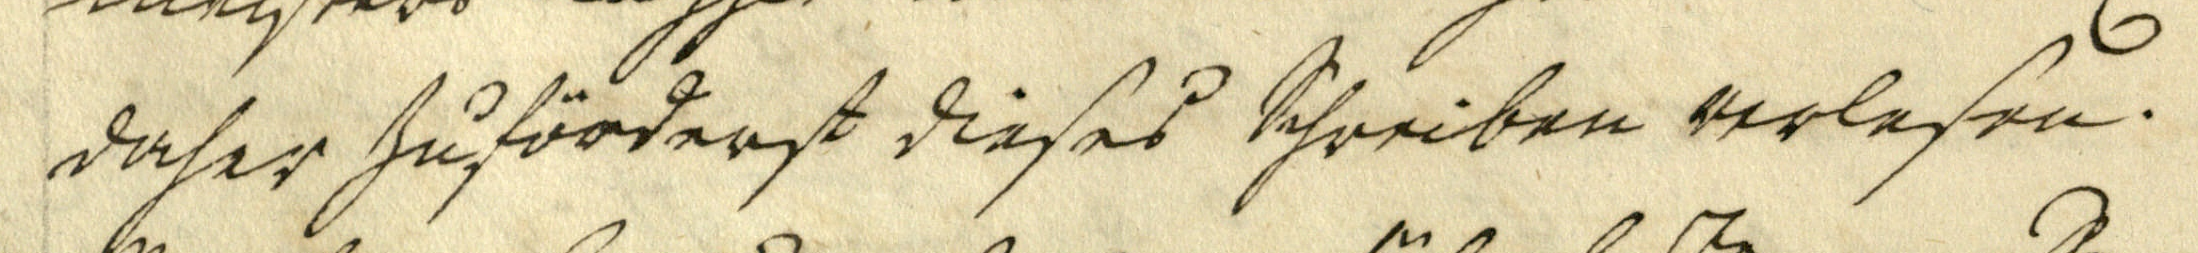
daher zuförderst dieses Schreiben verlesen.
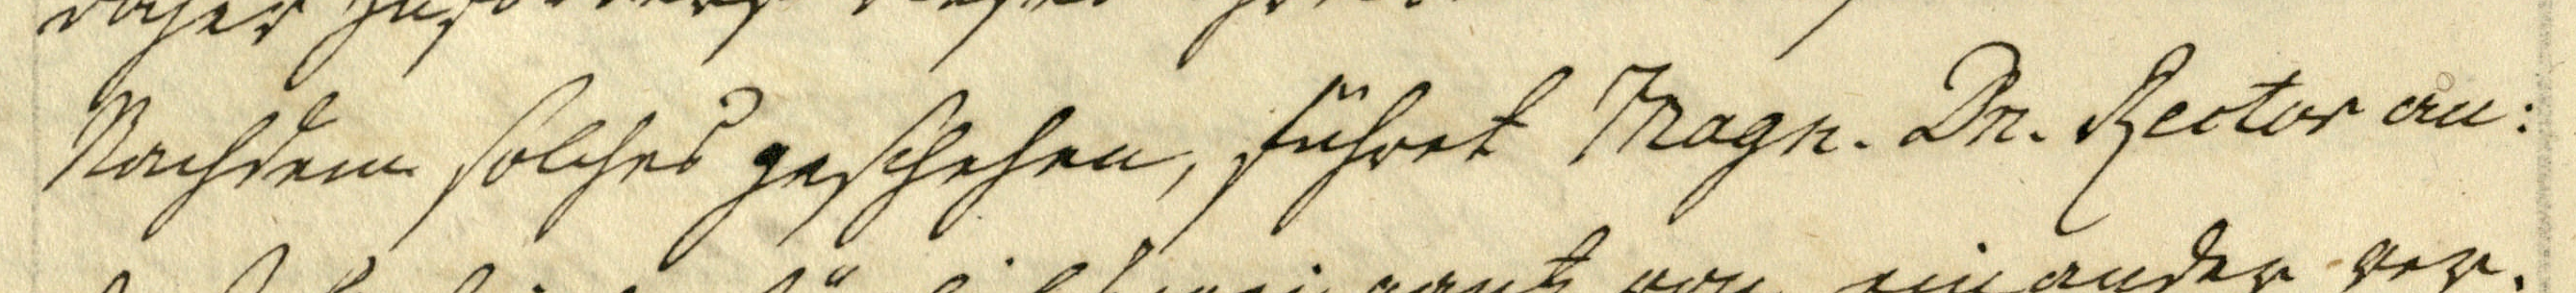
Nachdem solches geschehen, führet Magn. Dn. Rector an:
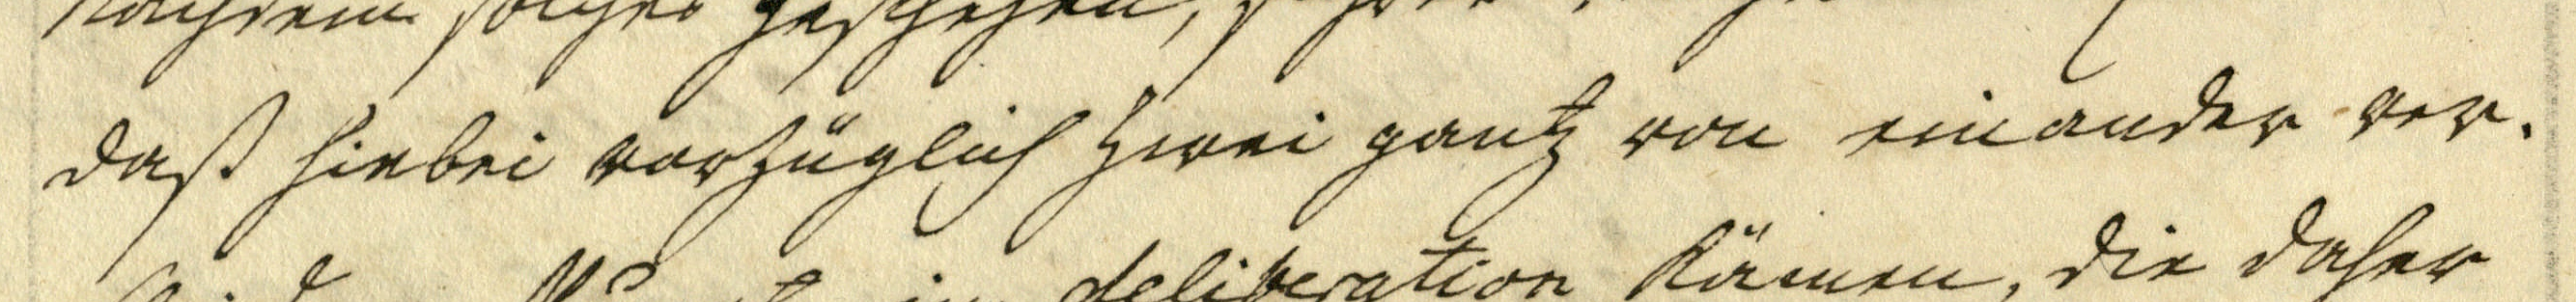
daß hiebei vorzüglich zwei gantz von einander ver¬
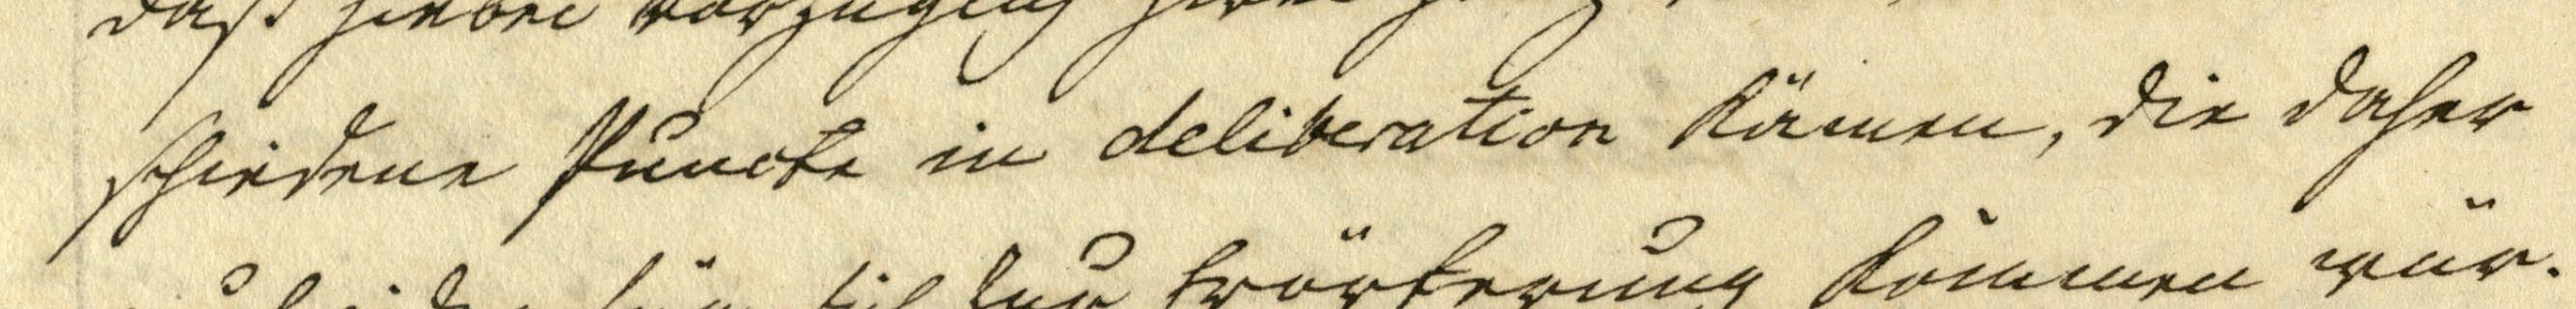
schiedene Puncte in deliberation kämen, die daher
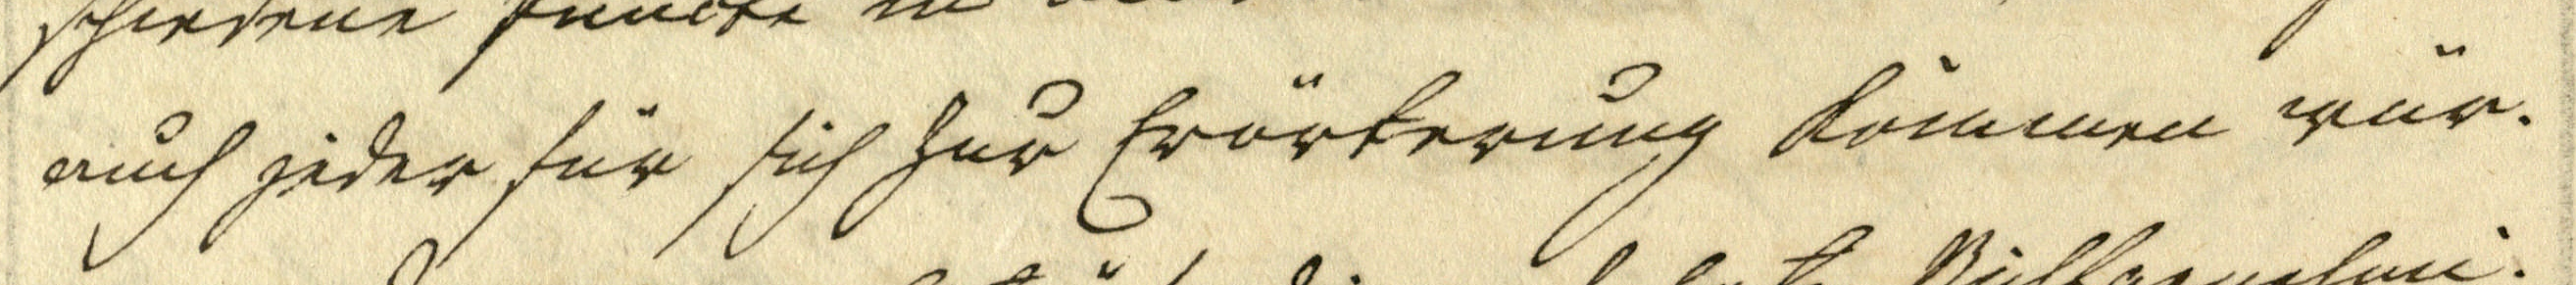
auch jeder für sich zur Erörterung kommen wür¬
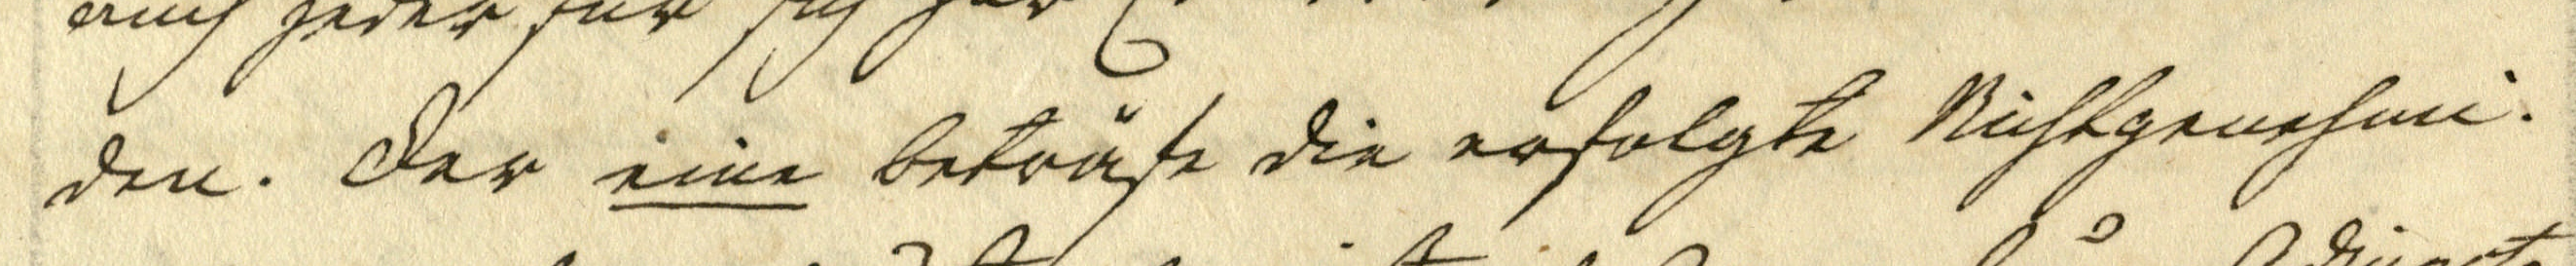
den. Der eine beträfe die erfolgte Nichtgenehmi¬
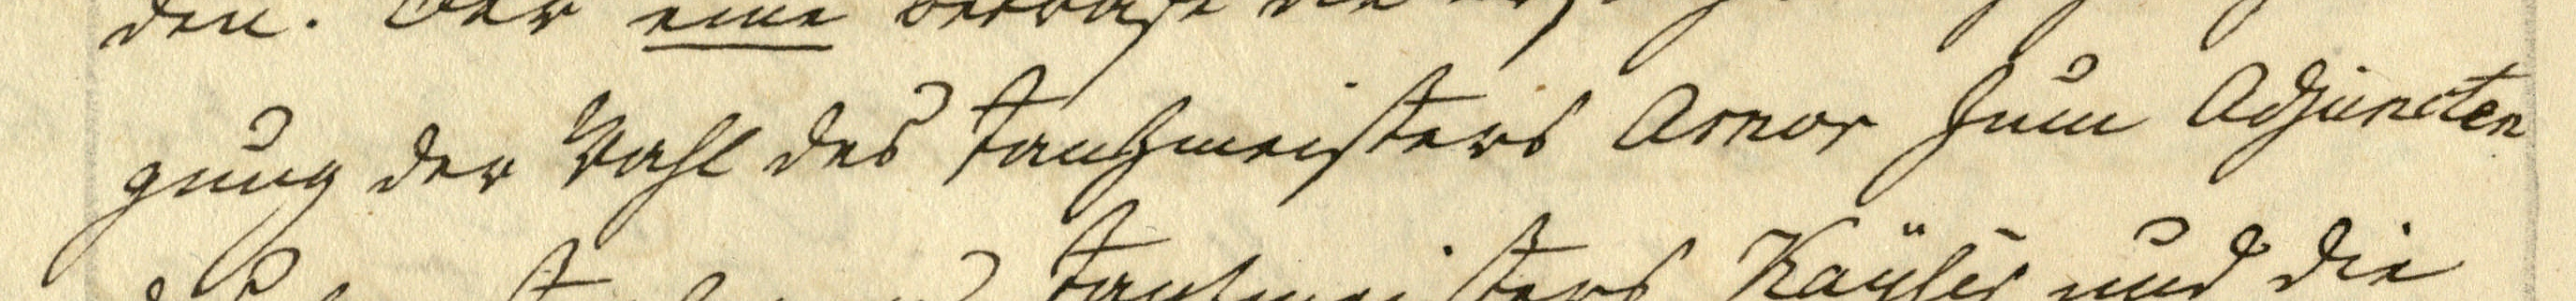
gung der Wahl des Tanzmeisters Amor zum Adjuncten
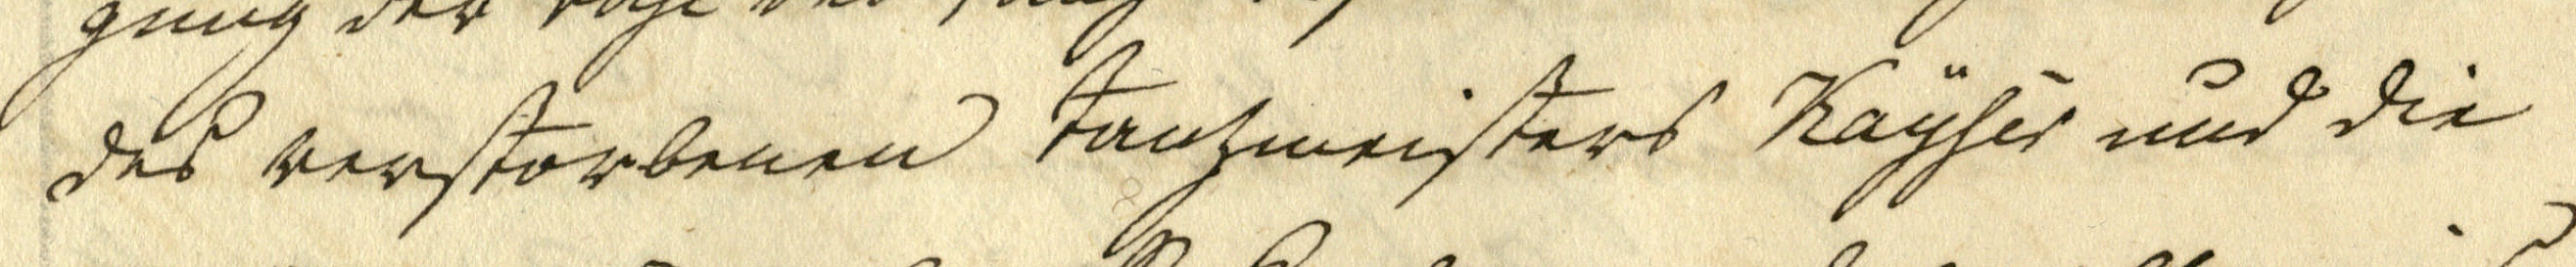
des verstorbenen Tanzmeisters Kayser und die
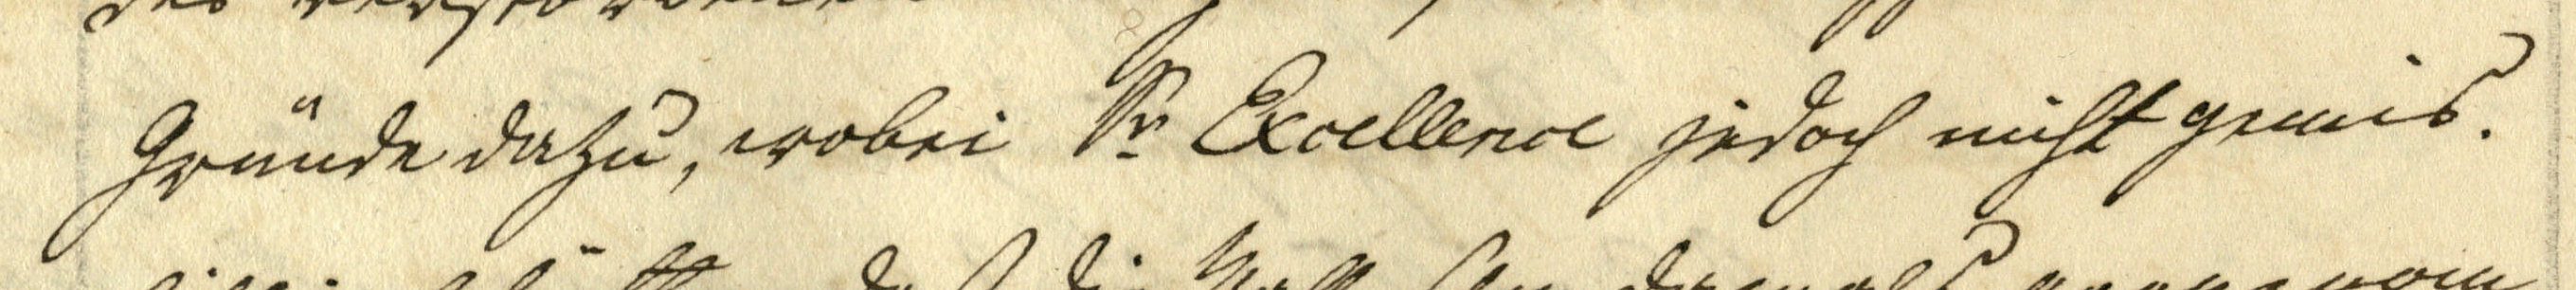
Gründe dazu, wobei Sr Excellence jedoch nicht gemis¬
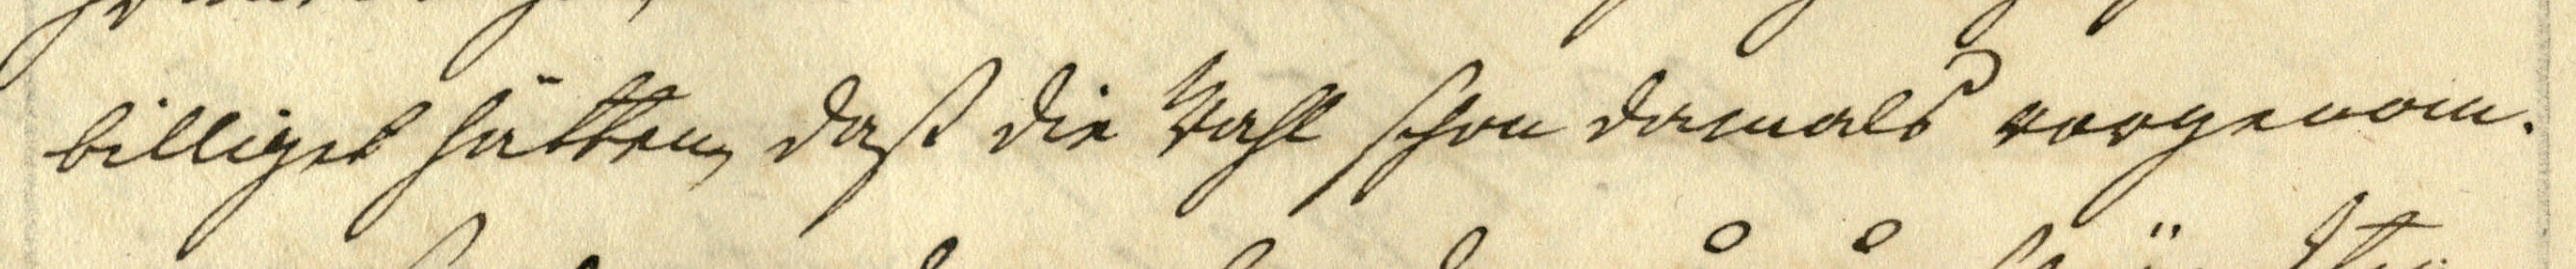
billiget hätten, daß die Wahl schon damals vorgenom¬
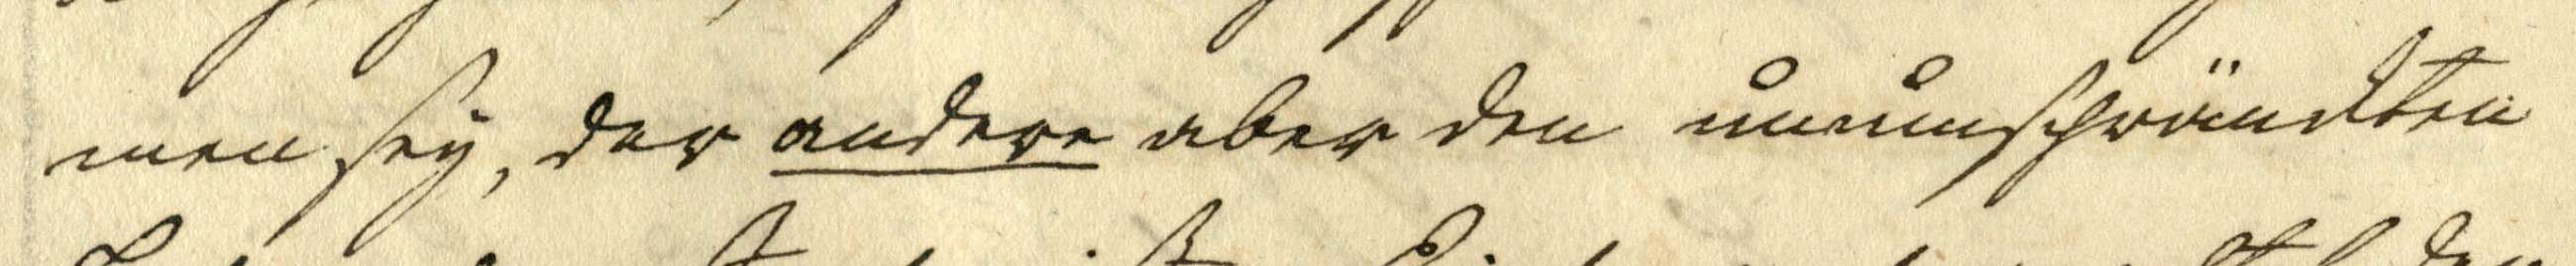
men sey, der andere aber den unumschränckten
